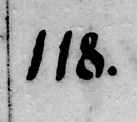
1.
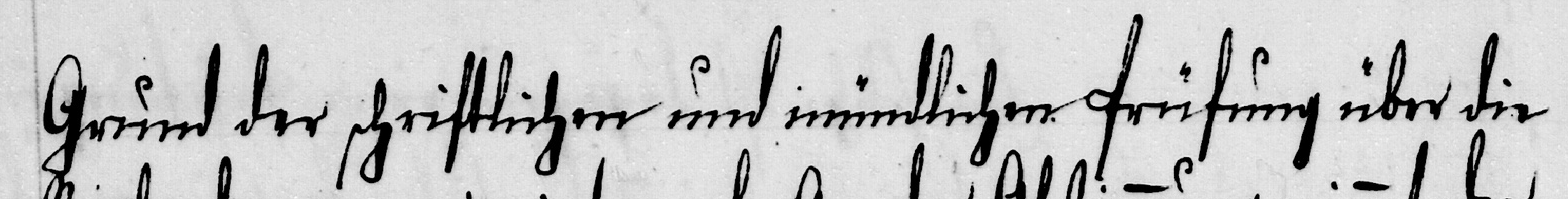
Grund der schriftlichen und mündlichen Prüfung über die
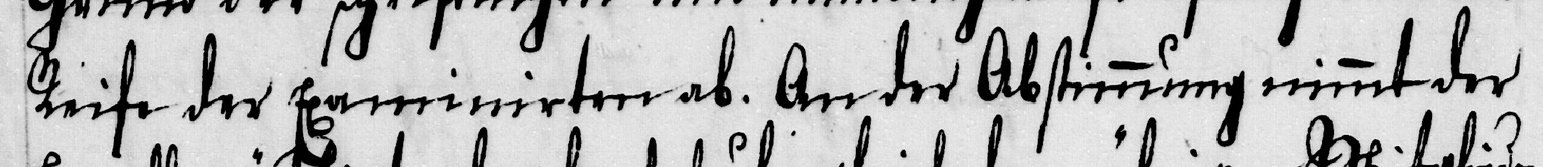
Reife der Examinanden ab. An der Abstimmung nimmt der
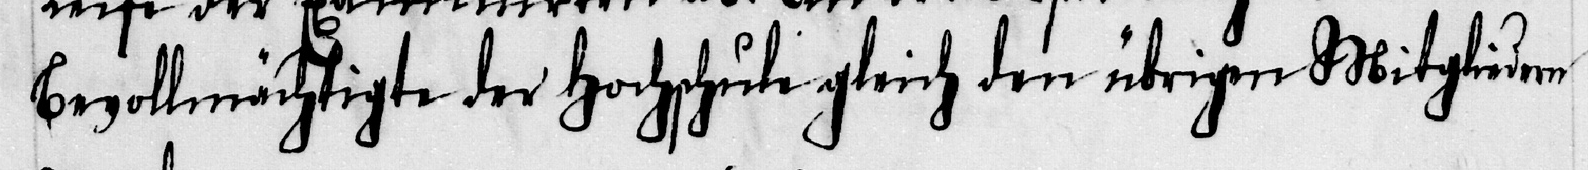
Bevollmächtigte der Hochschule gleich den übrigen Mitgliedern
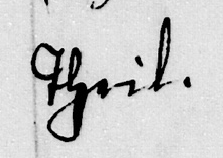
Theil.
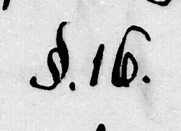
§. 16.
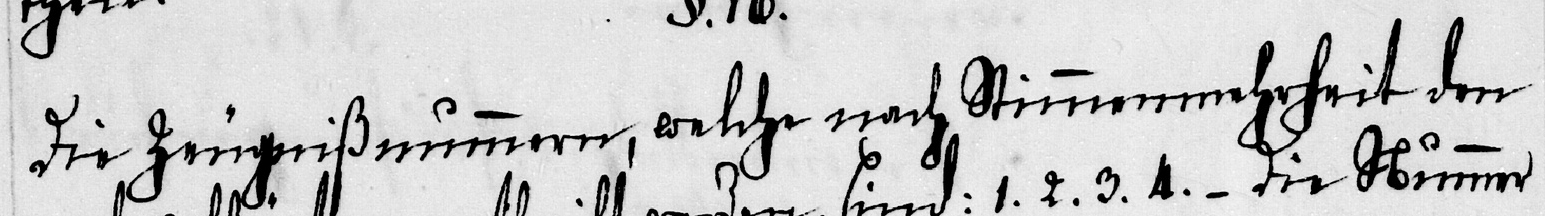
Die Zeugnißnummern, welche nach Stimmenmehrheit den
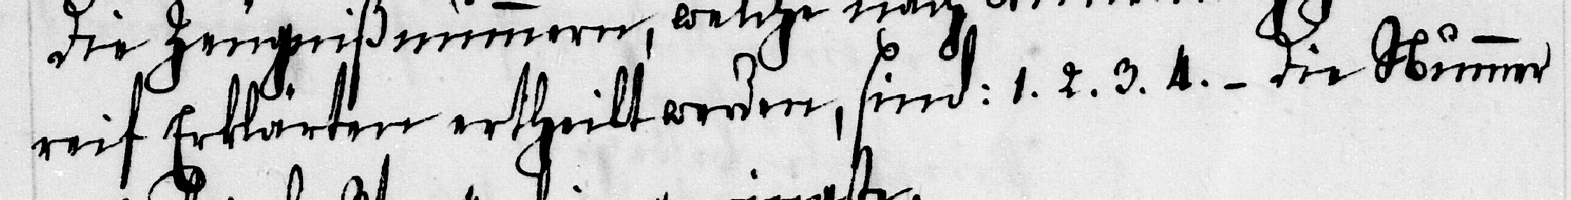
reif Erklärten ertheilt werden, sind: 1. 2. 3. 4. – Die Nummer
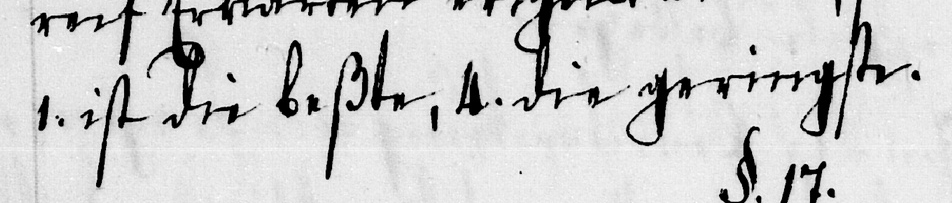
ist die beßte, 4. die geringste.
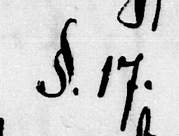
§. 17.
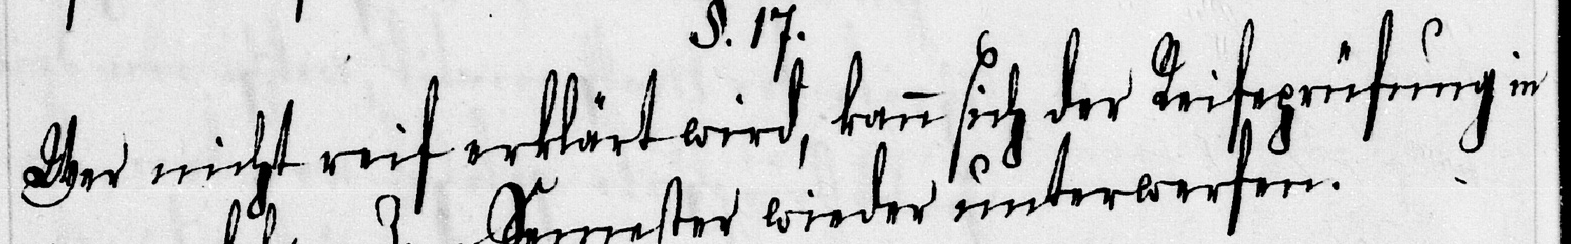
Wer nicht reif erklärt wird, kann sich der Reifeprüfung in
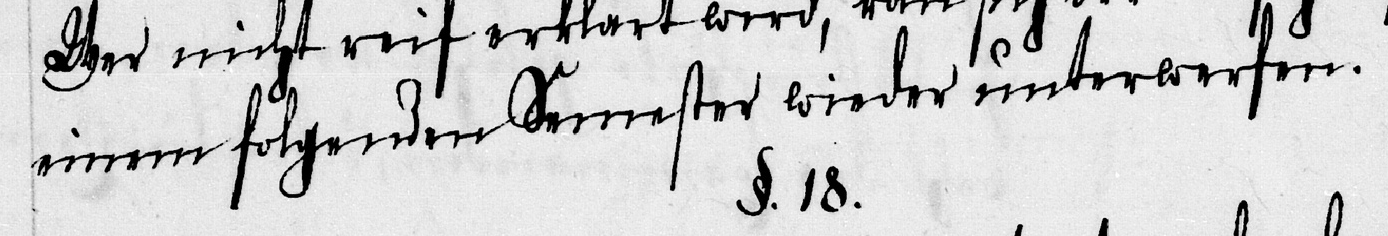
einem folgenden Semester wieder unterwerfen.
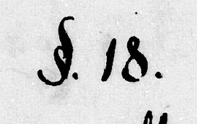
§. 18.
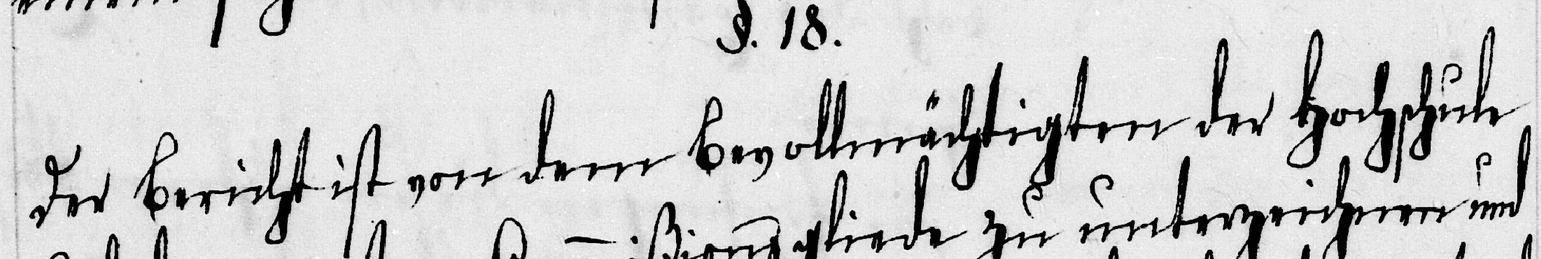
Der Bericht ist von dem Bevollmächtigten der Hochschule
